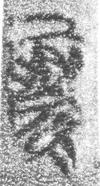○（屨）
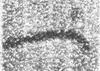一
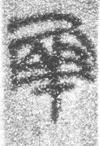兩
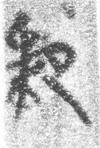厀（漆）
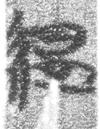緹（鞮）
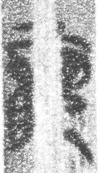○（屨）
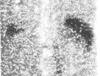一
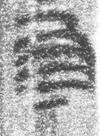兩
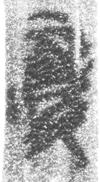○（屨）
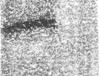一
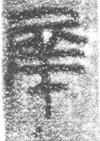兩
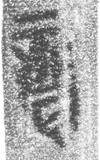○（屨）
